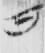日
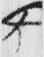不
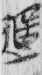𬨭（將）
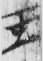玉
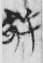○（令）
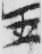玉
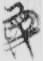婁
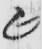㠯（以）
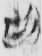○（廷）
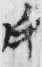阩
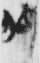門
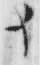又（有）
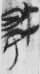敗
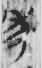秀
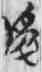脺
